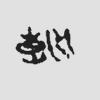朝
